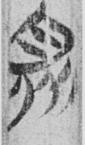衆
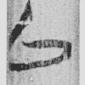㠯（以）
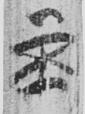不
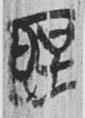聖
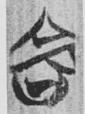命
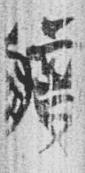𨟻（將）
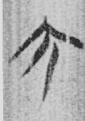大
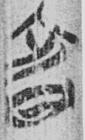害
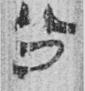公
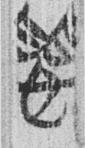○（懼）
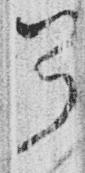乃
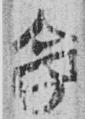命
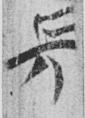長
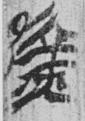魚
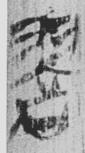翯（矯）
